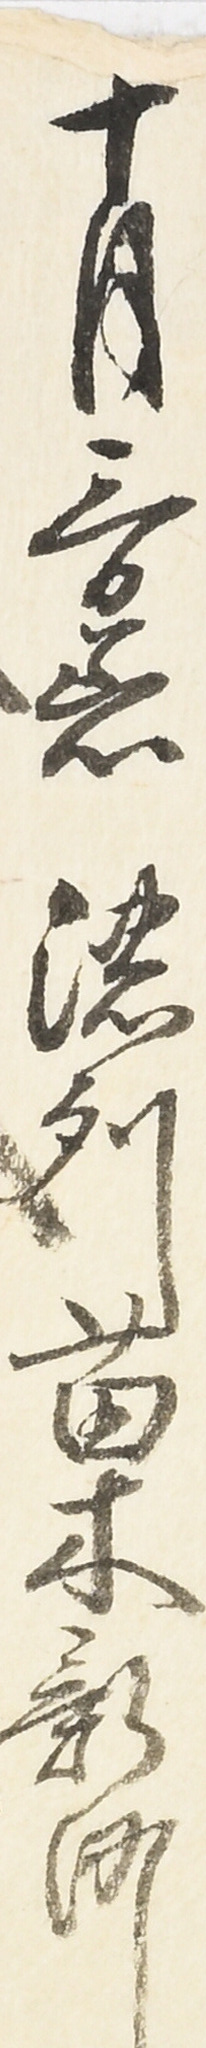十月三日着濃州苗木新町
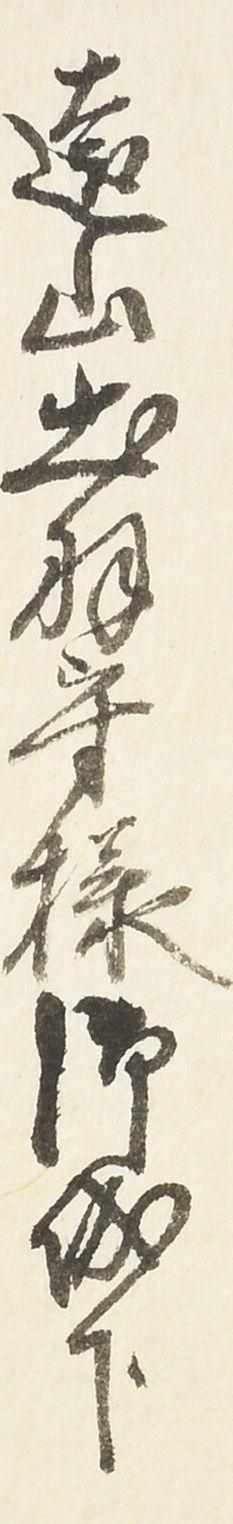遠山出羽守様御城下
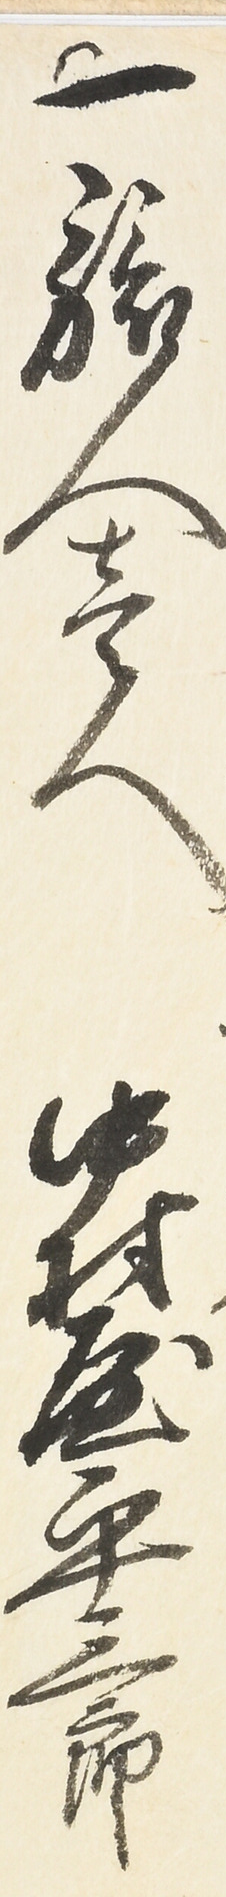一旅人壱人中村屋平三郎
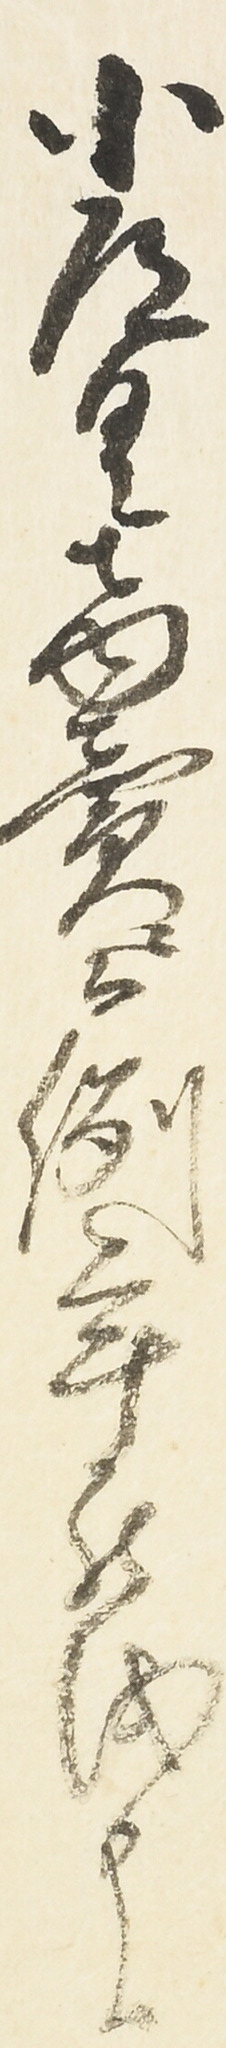小道具商売ニ而例年罷越申候
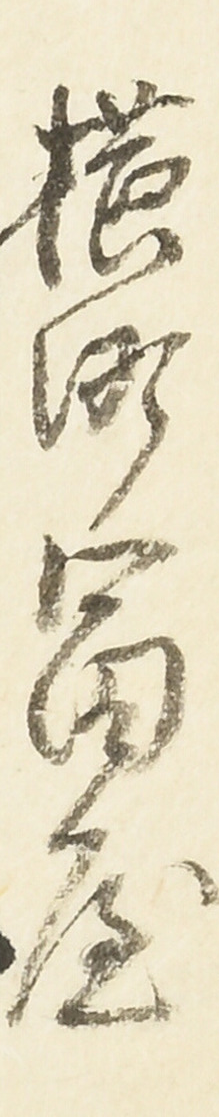横町塩屋
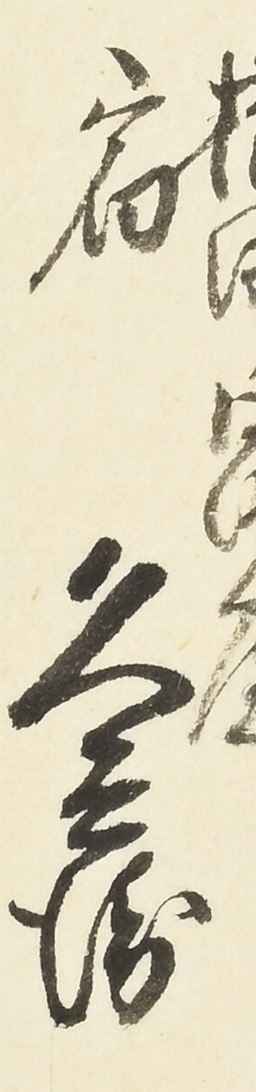宿久兵衛
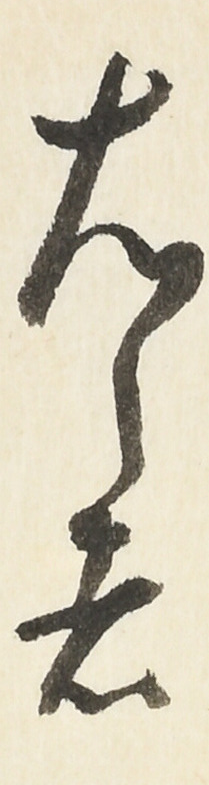右之者
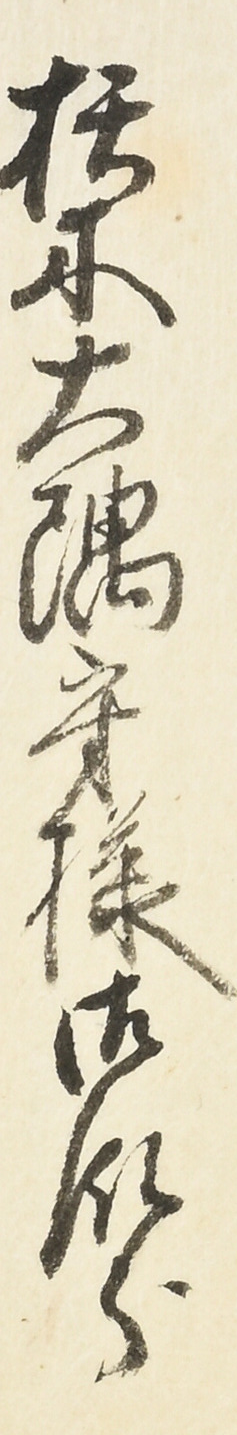朽木大隅守様御領分
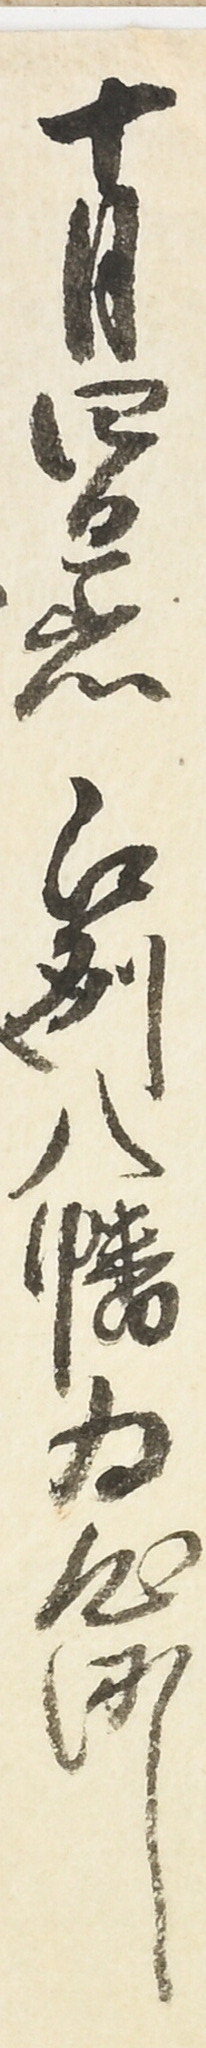十月四日着江州八幡為心町
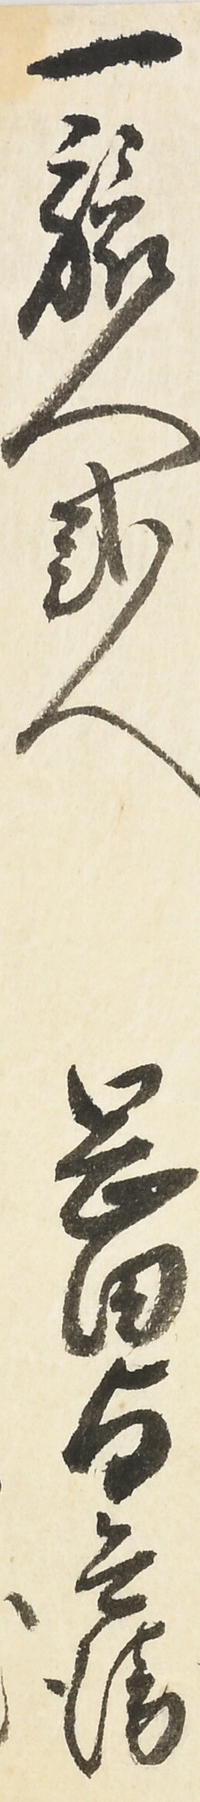一旅人弐人岡田与兵衛
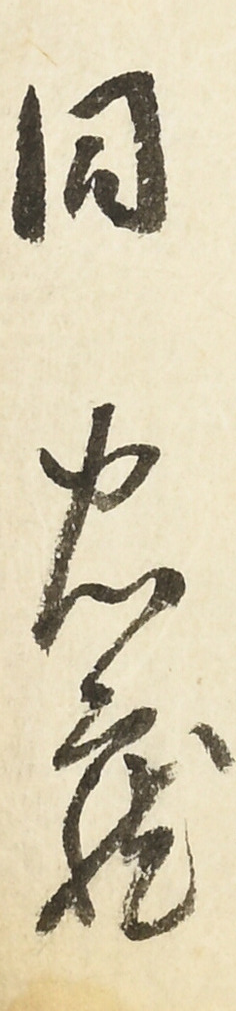同忠蔵

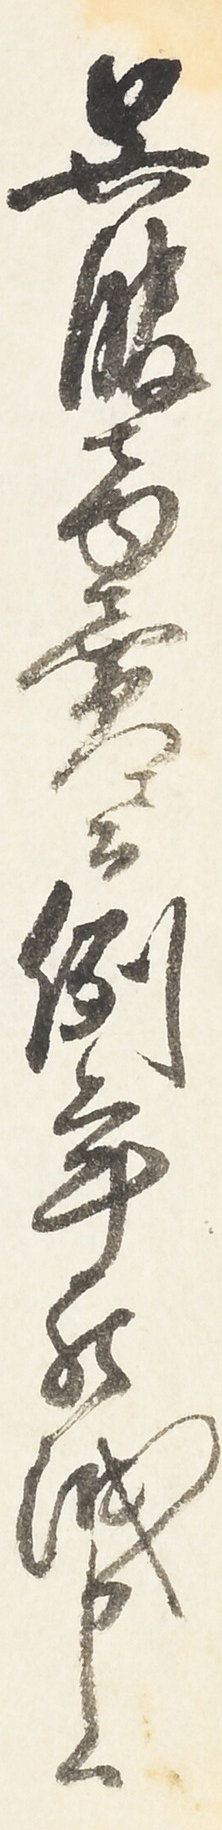呉服商売ニ而例年罷越申候
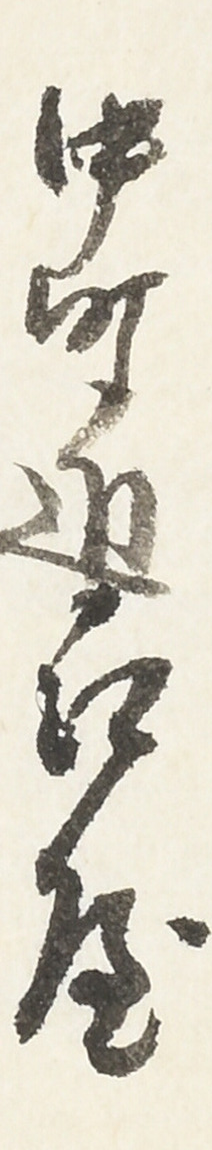中町近江屋
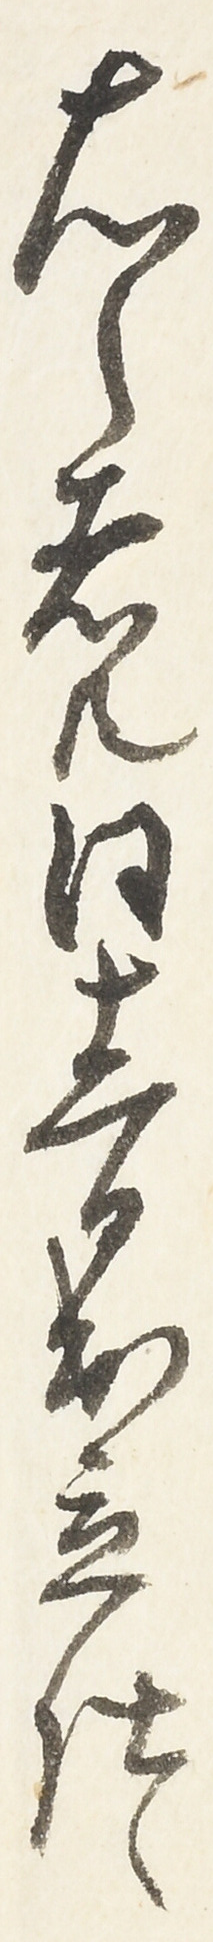右之者共同十二日出立仕候
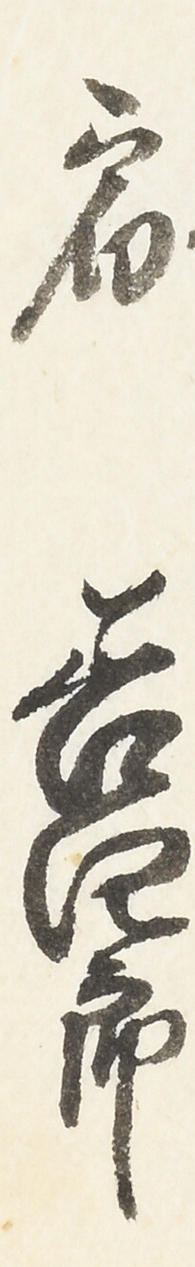宿善四郎
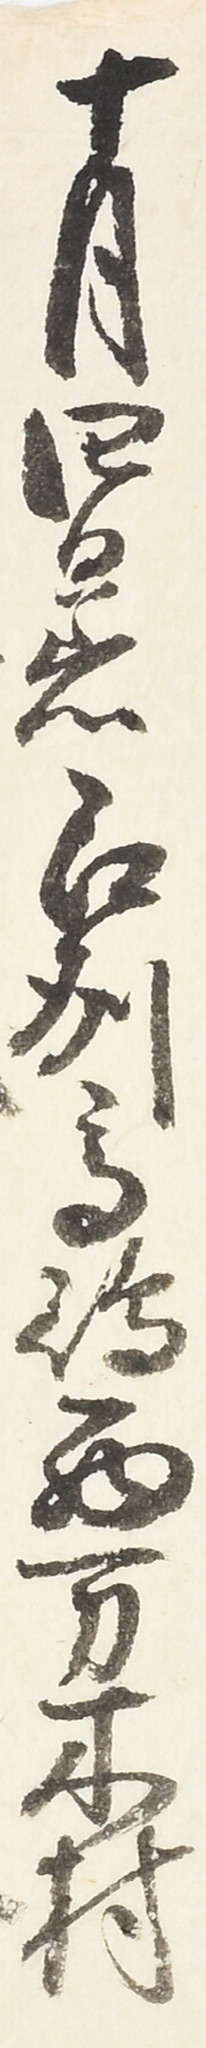十月四日着江州高嶋西万木村
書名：町中旅人泊控帳
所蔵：伊那市立高遠町図書館・合同会社AMANE
